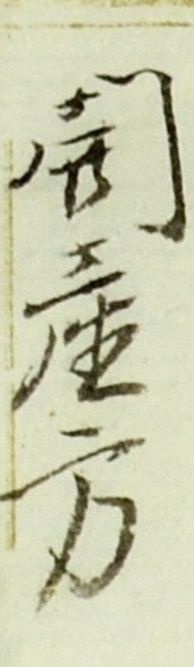開産方
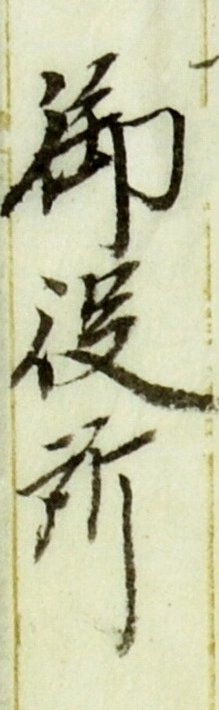御役所
